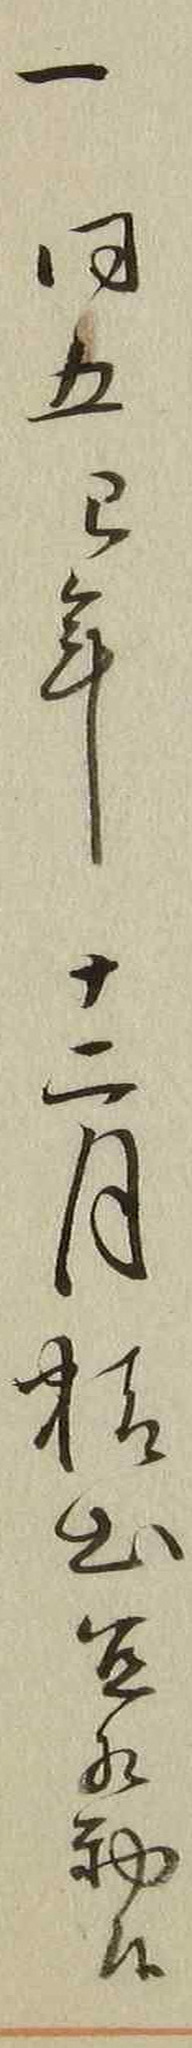一同五年已年十二月精出宜相勤候
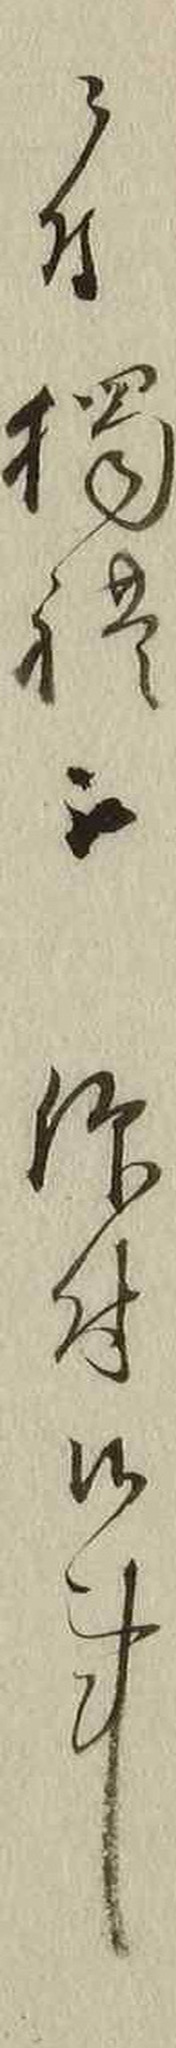ニ付独礼被仰付候事
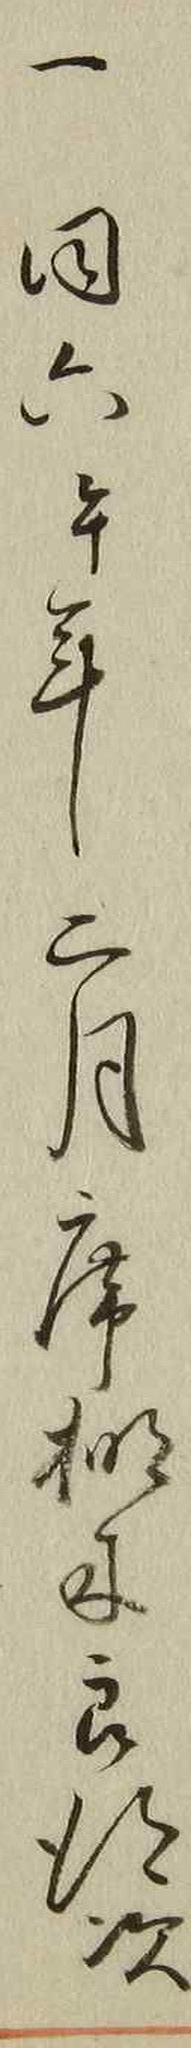一同六午年二月席棚木良得次
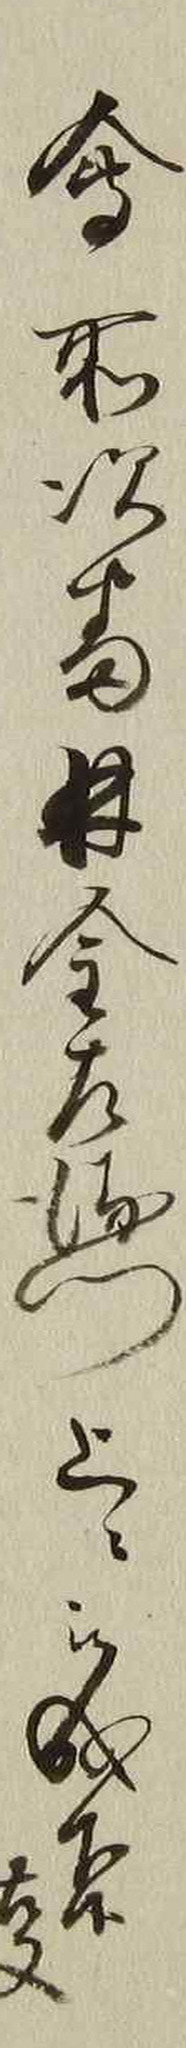会所次番林金左衛門上ニ被成下候事
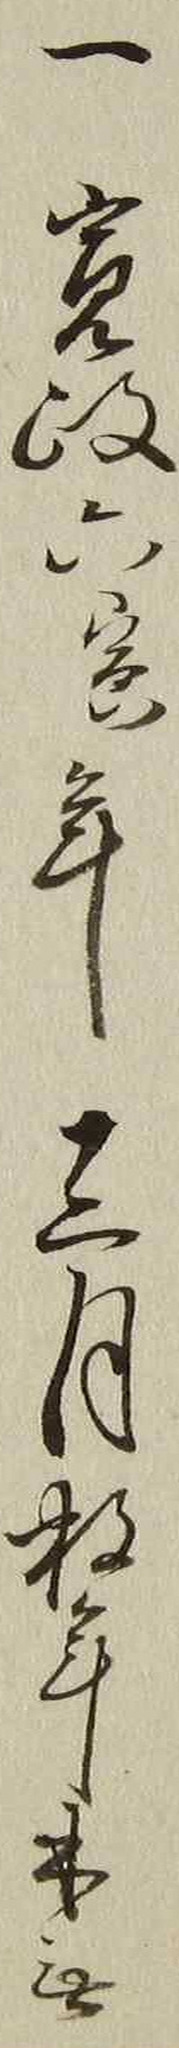一寛政六寅年十二月数年来無
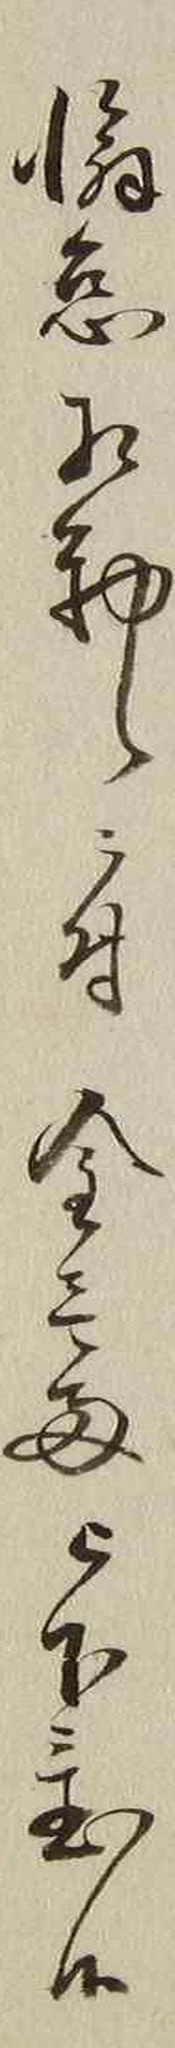懈怠相勤候ニ付金壱両被下置候
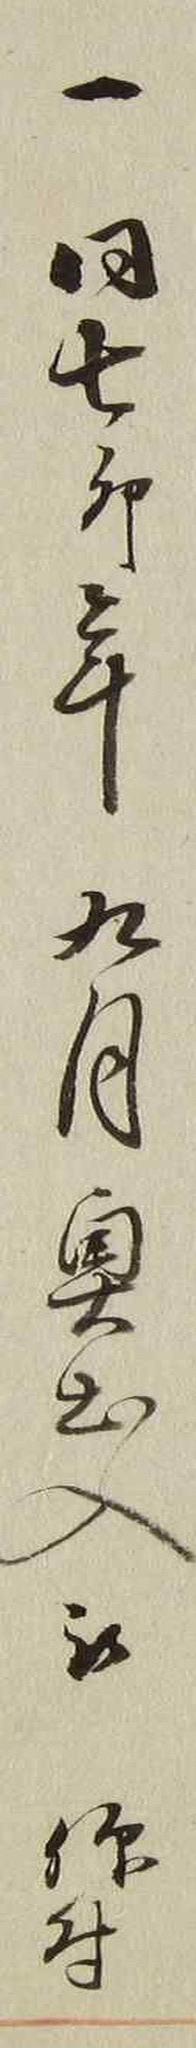一同七卯年九月奥出入被仰付
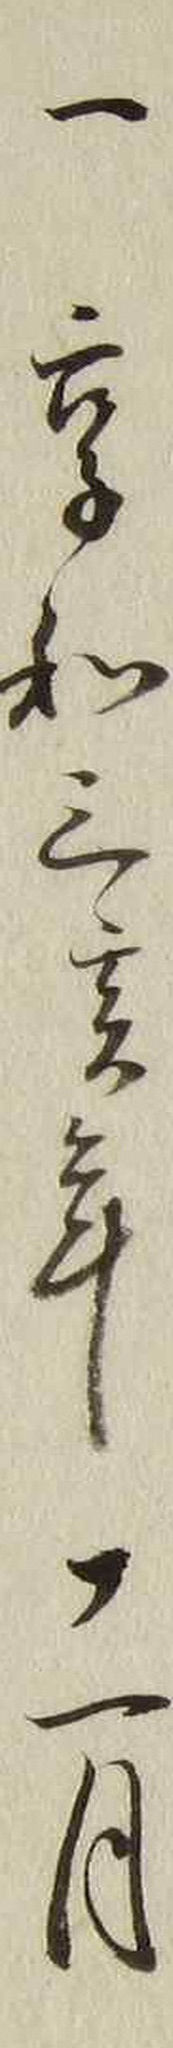一享和三亥年十一月
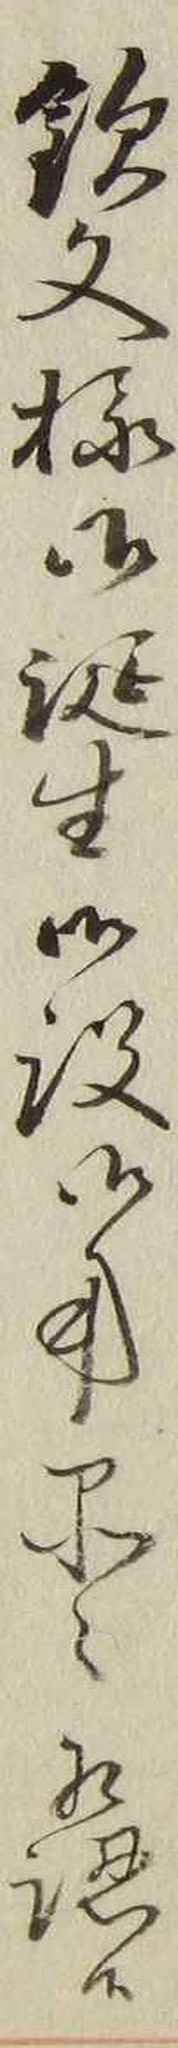欽文様御誕生御設御用品々相認候
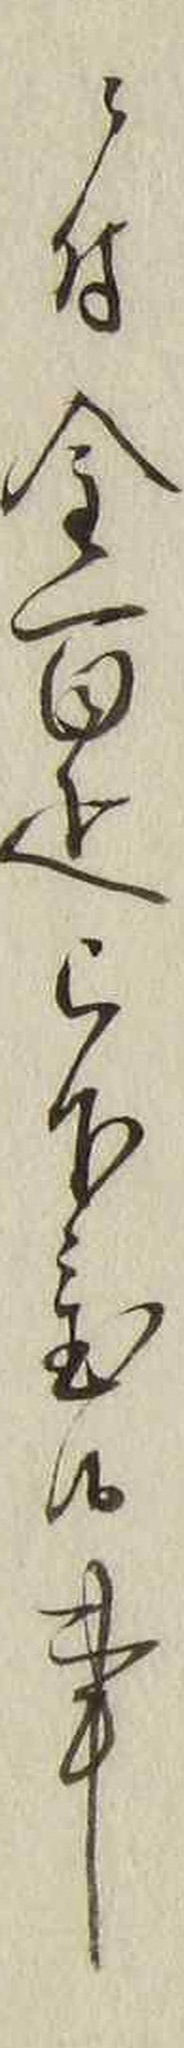ニ付金百疋被下置候事
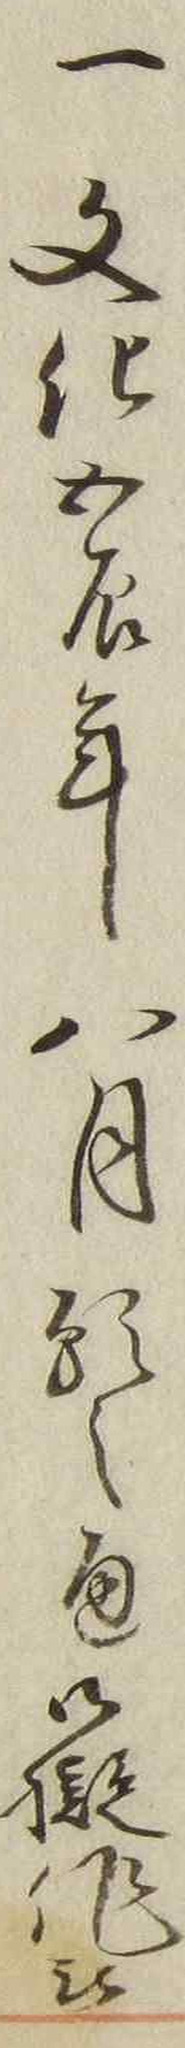一文化五辰年八月願之通御擬作被

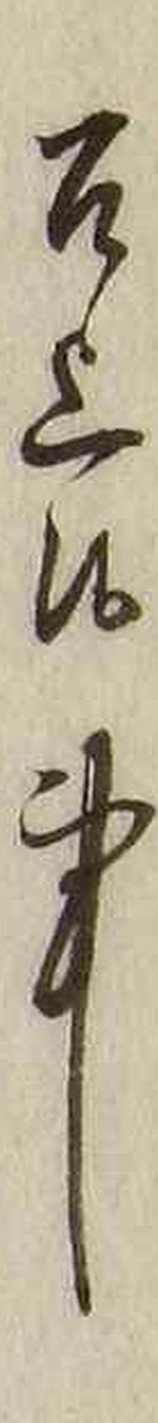召上候事
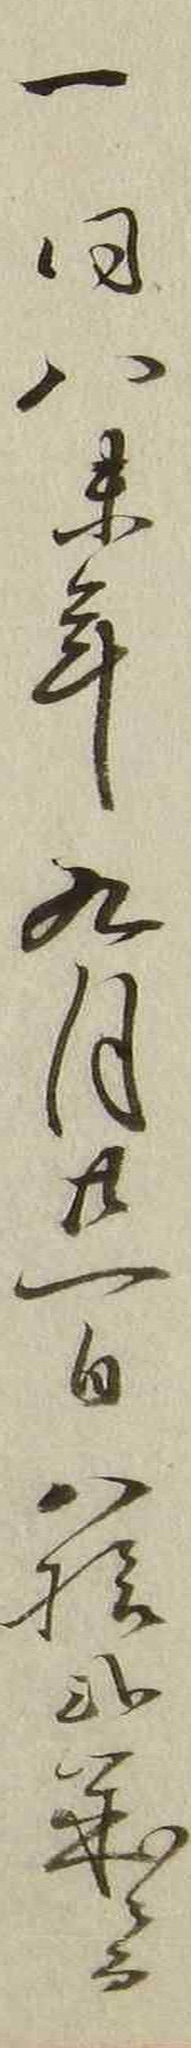一同八末年九月廿一日八拾弐歳ニ而
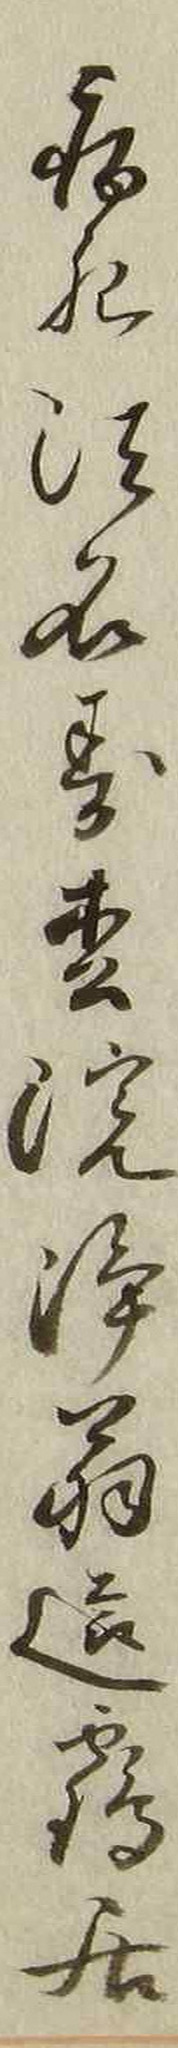病死法名寿松院浄翁遠鶴居
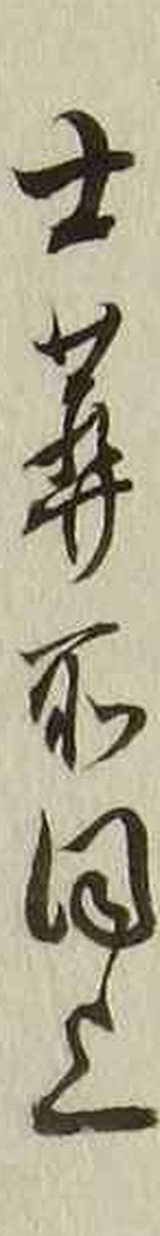士葬所同上
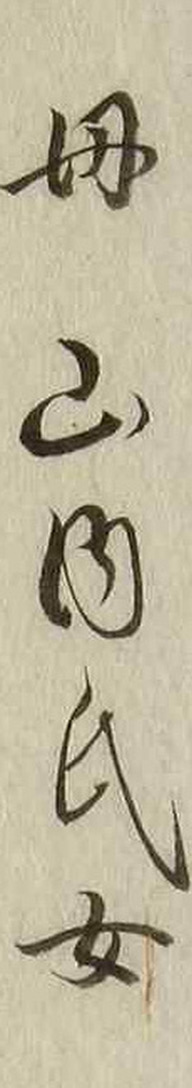母山内氏女
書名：諸士系譜　巻之132　た之部8
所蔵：会津若松市立会津図書館
